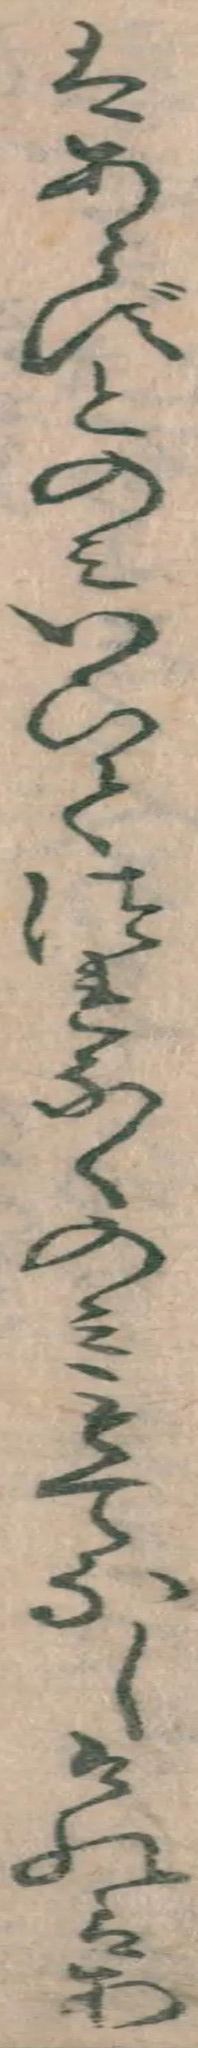はあらずとのみいひてつれなくのみもてなしけれはあ
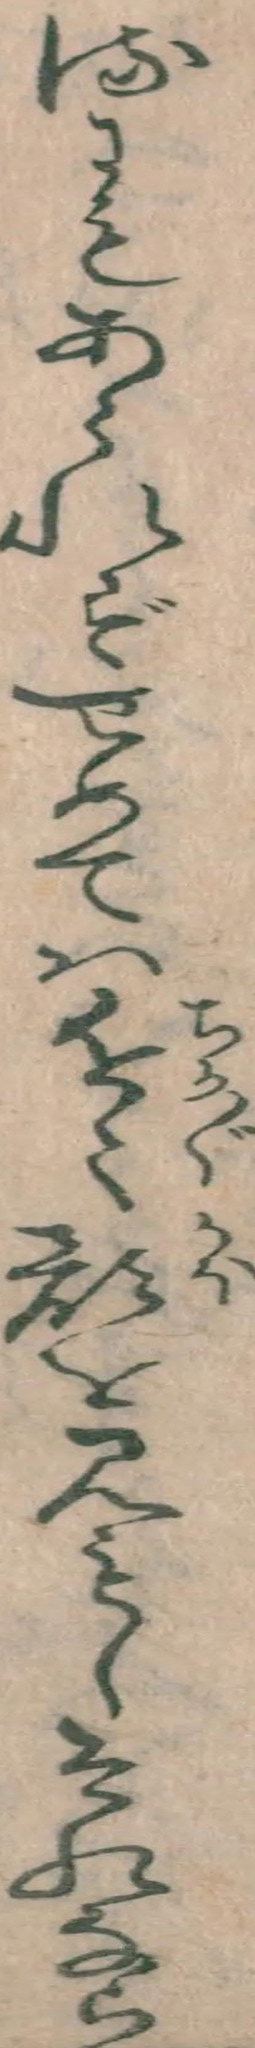るにもあられずせめては近々顔を見もしそれなら
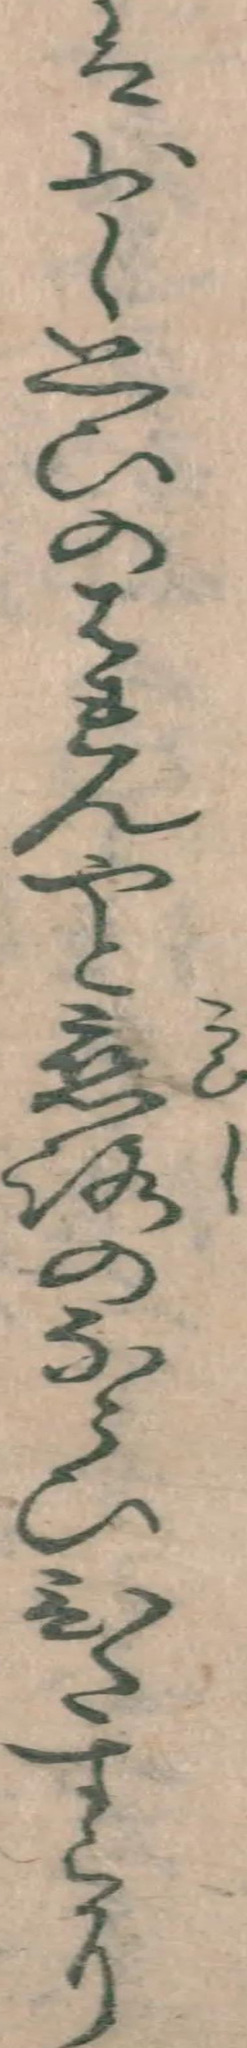は少し思ひのはれんやと恋路のならひひたすらに
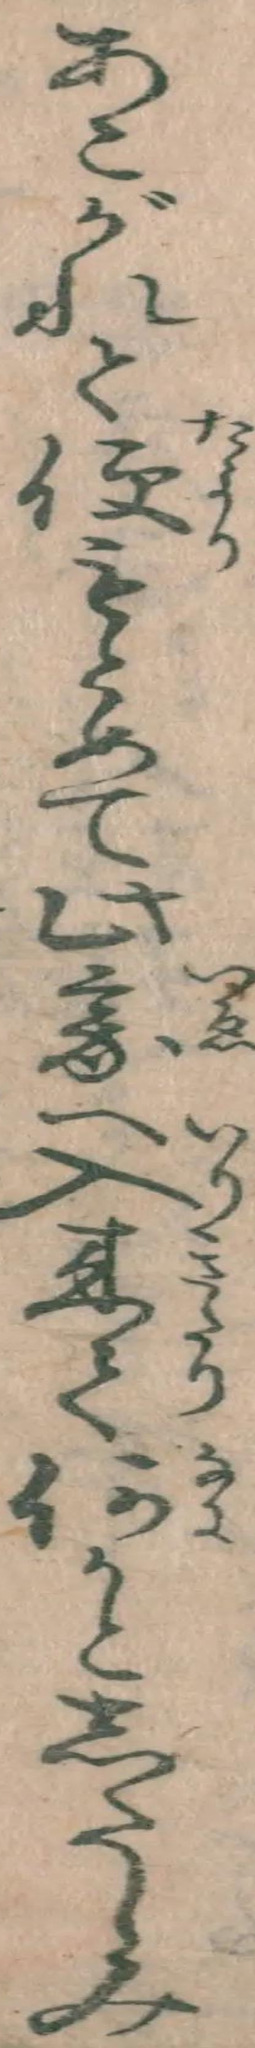あこがれて便もとめて此家へ入来て何かとしたしみ
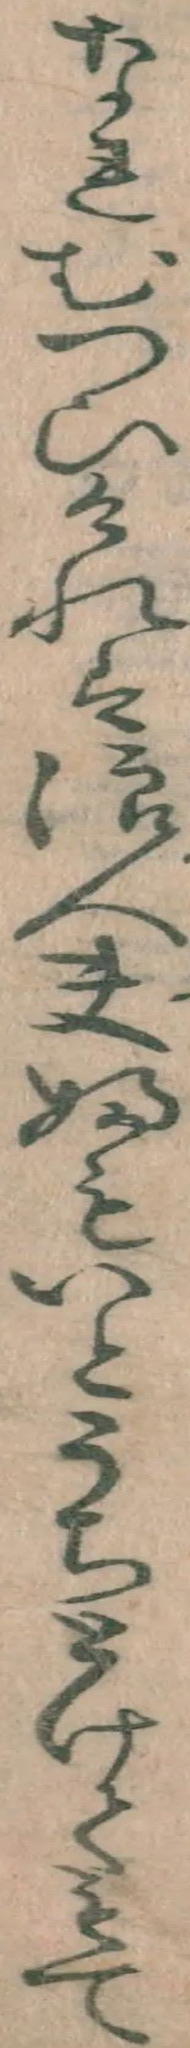なれむつひけれは浪人夫婦もいとうちとけてもて
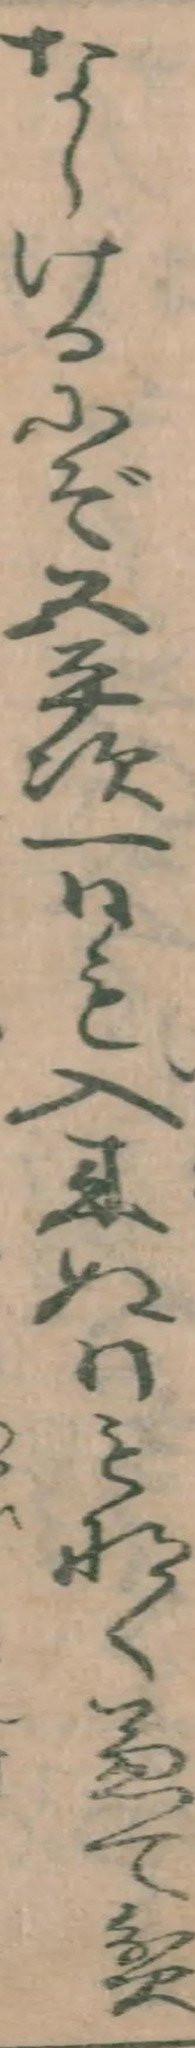なしけるにぞ五平次一日も入来ぬ日もなく兼て貧
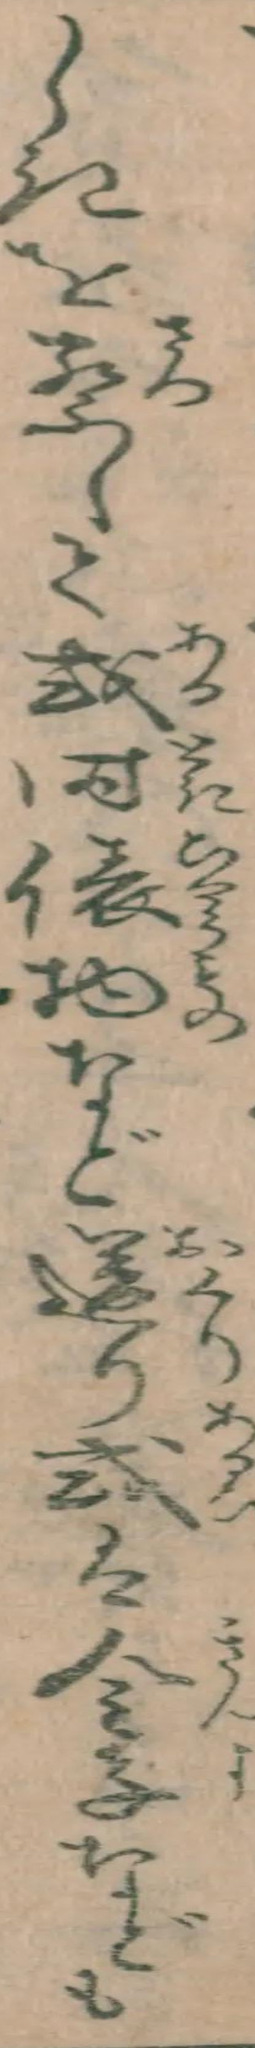しきを察して或時俵物など送り或は金子なども
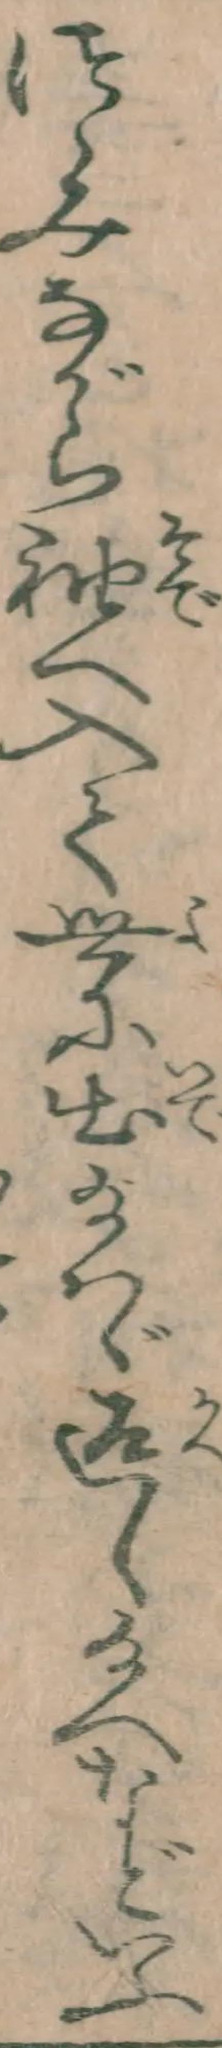つゝみながら袖へ入て世に出給はゞ返して給へなどいふ
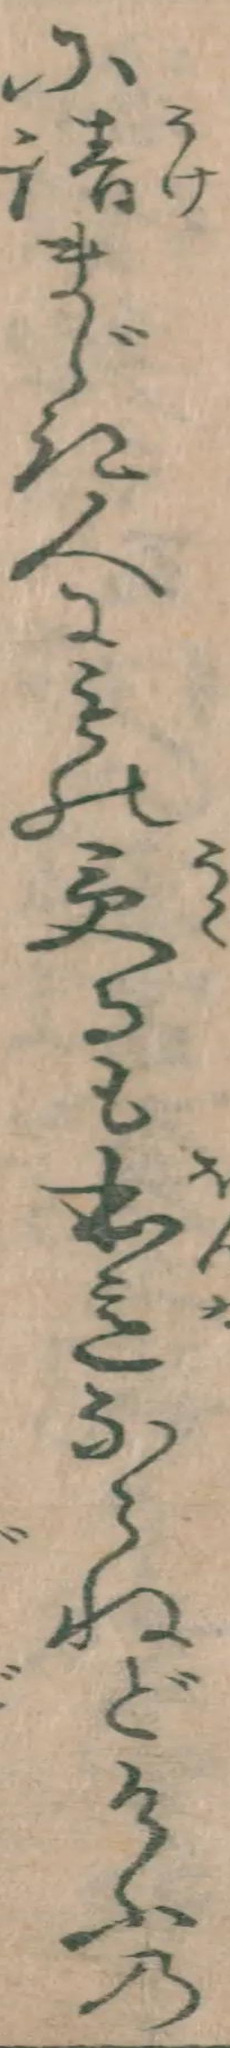に請まじき人にもの受るも本意ならねどけふの
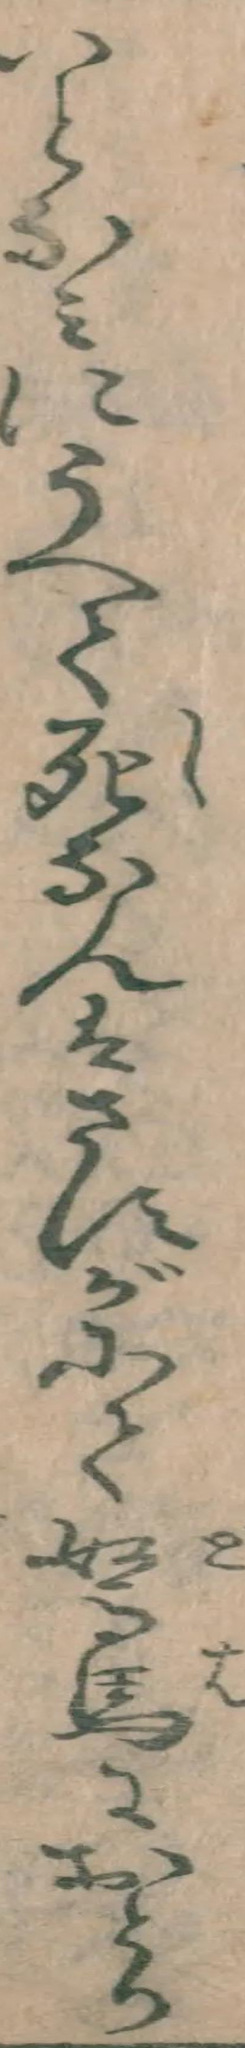いとなみにうへて死なんはさすがにて駑馬におとり
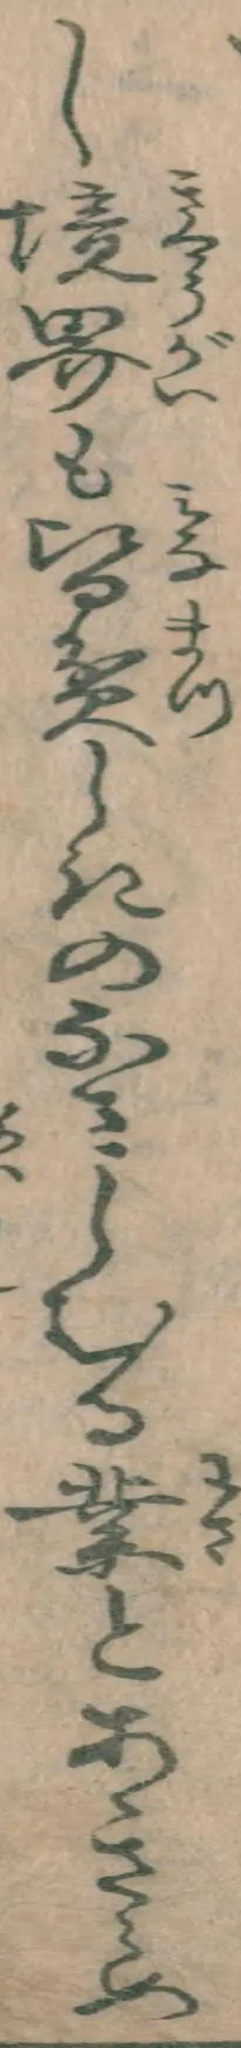し境界も皆貧しきのなさしむる業とあきらめ
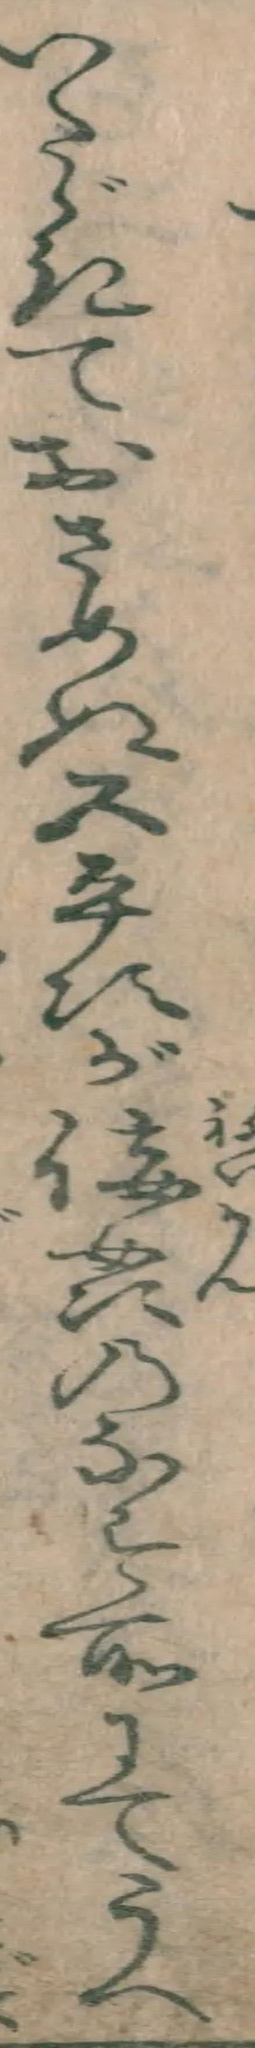いたゞきておさめぬ五平次が佞奸のなす所にてうへ
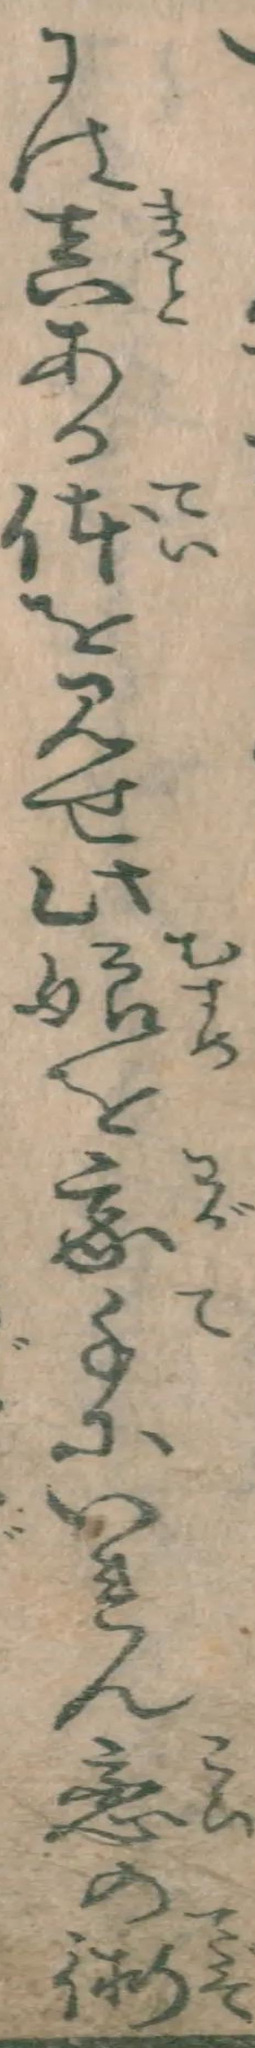には真ある体を見せ此娘を我手にいれん恋の術
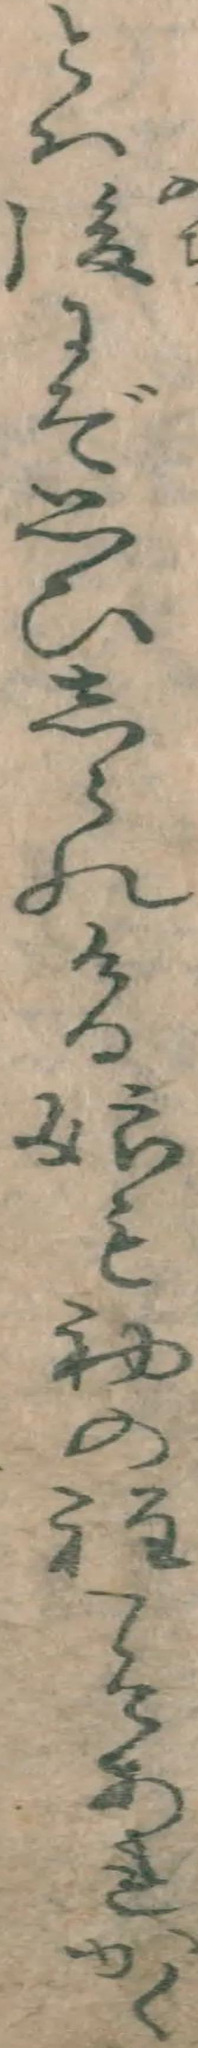とは後にぞ思ひしられける娘も初の程こそあれかく
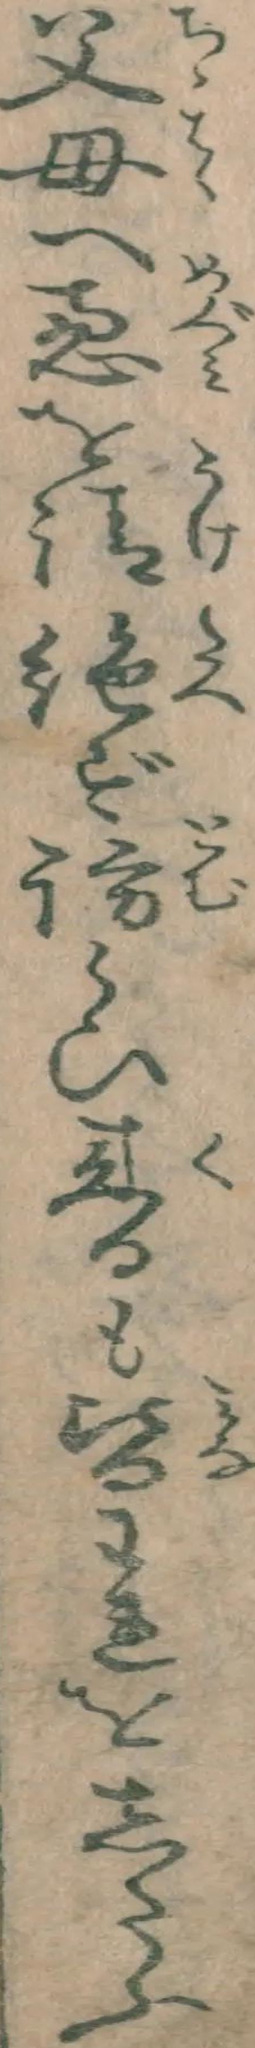父母へ恵を請絶ず訪らひ来るも皆われをしたふ

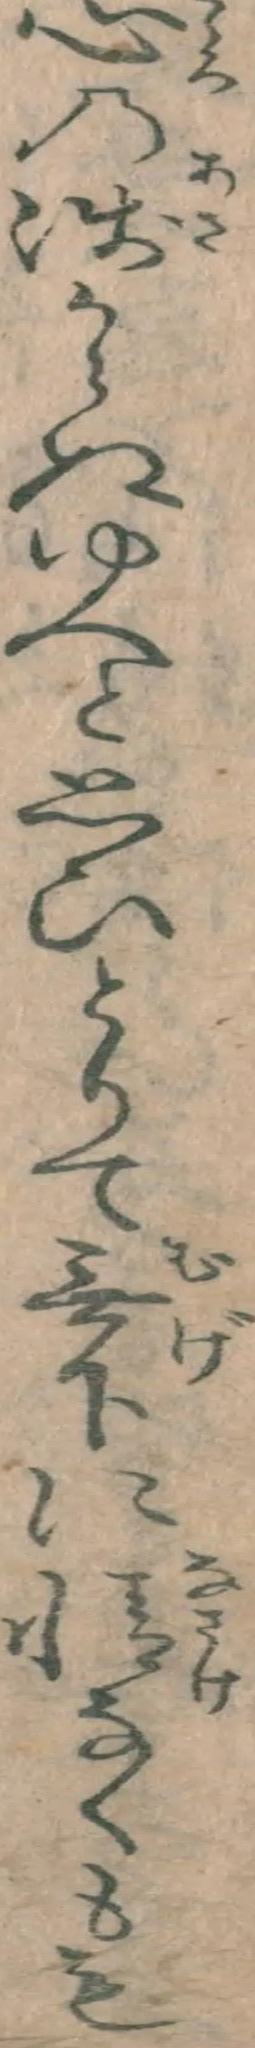心の浅からぬゆへと思ひとりて無下に情なくもも
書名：怪談御伽童 5巻. [2]
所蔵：国立国会図書館 National Diet Library, JAPAN
